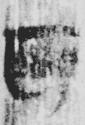取
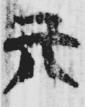亓（其）
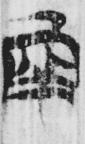兩
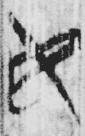女
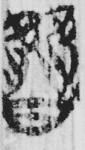朁（琰）
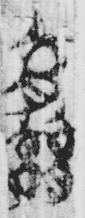○（琬）
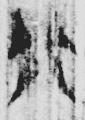北
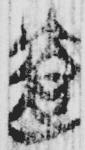迲（去）
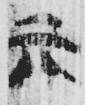亓（其）
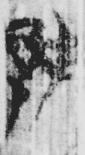邦
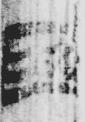爲
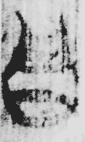丹
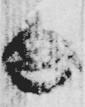宮
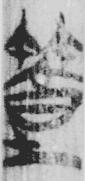○（築）
